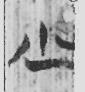少
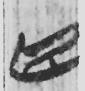臣
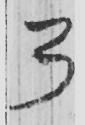乃
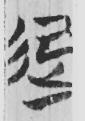起（起）
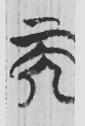而
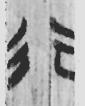行
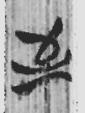至
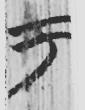于
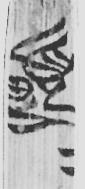{日止頁}（夏）
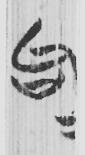句=
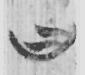曰
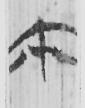尔
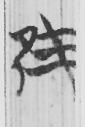隹
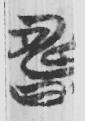𠷎
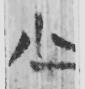少
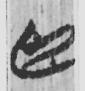臣
